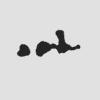敬
